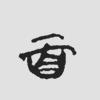百
